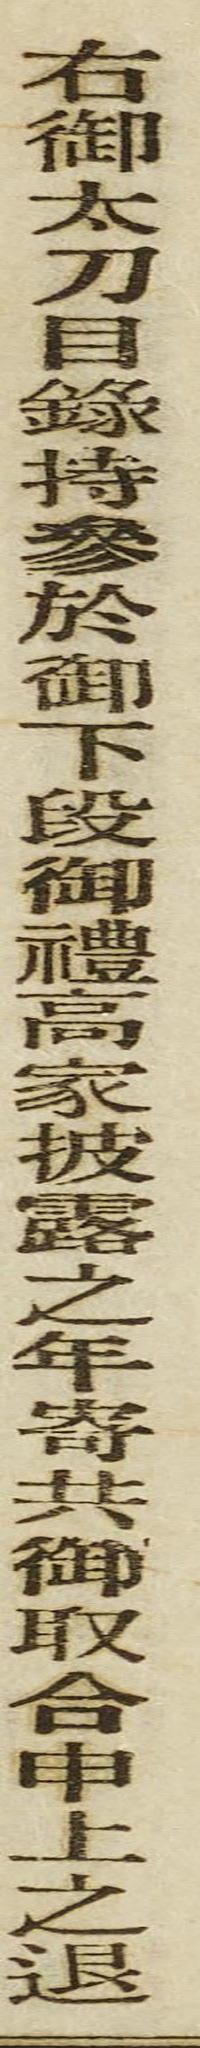右御太刀目録持参於御下段御礼高家披露之年寄共御取合申上之退

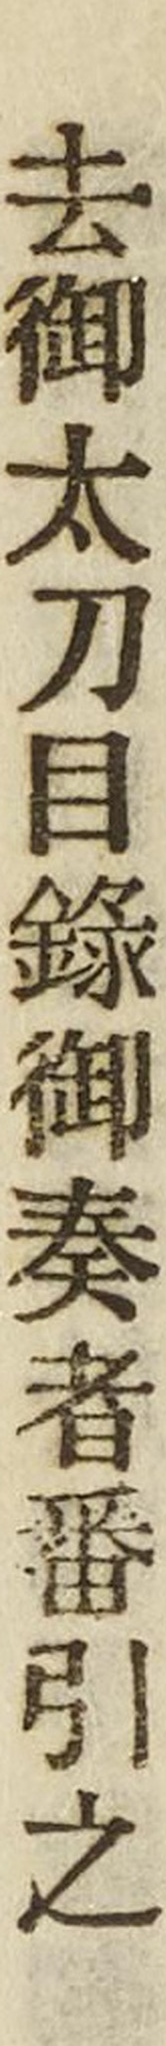去御太刀目録御奏者番引之
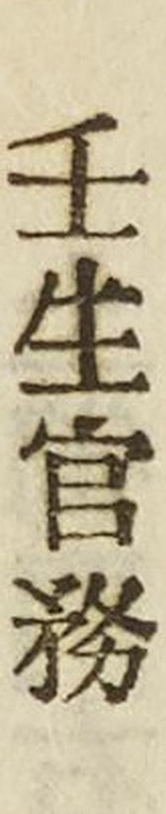壬生官務
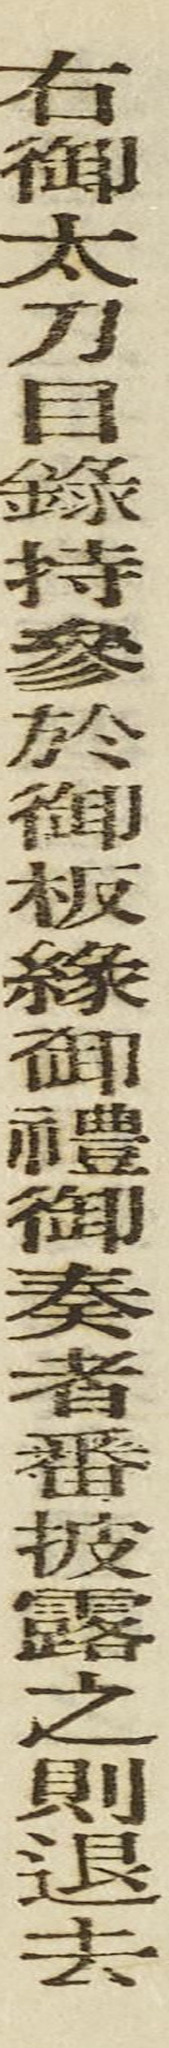右御太刀目録持参於御板縁御礼御奏者番披露之則退去
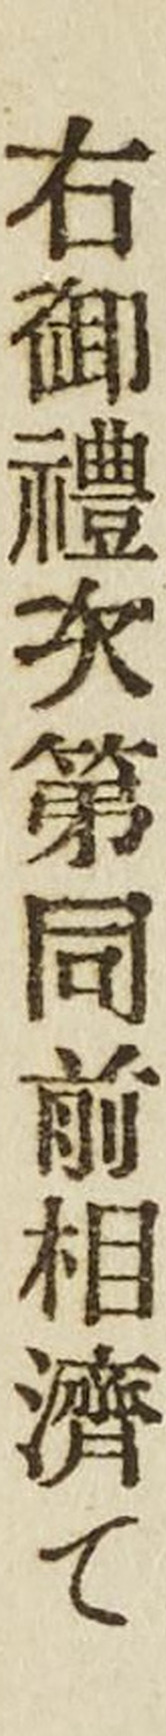右御礼次第同前相済て
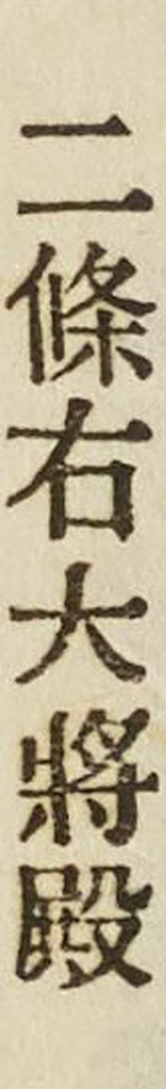二條右大将殿
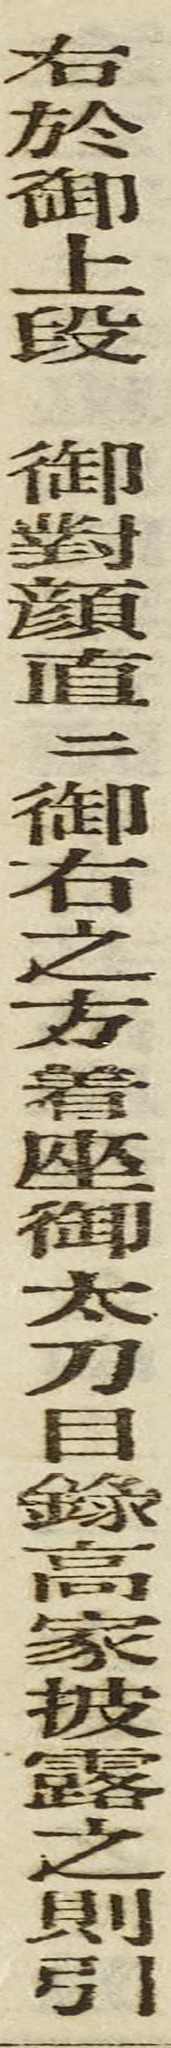右於御上段御対顔直ニ御右之方着座御太刀目録高家披露之則引
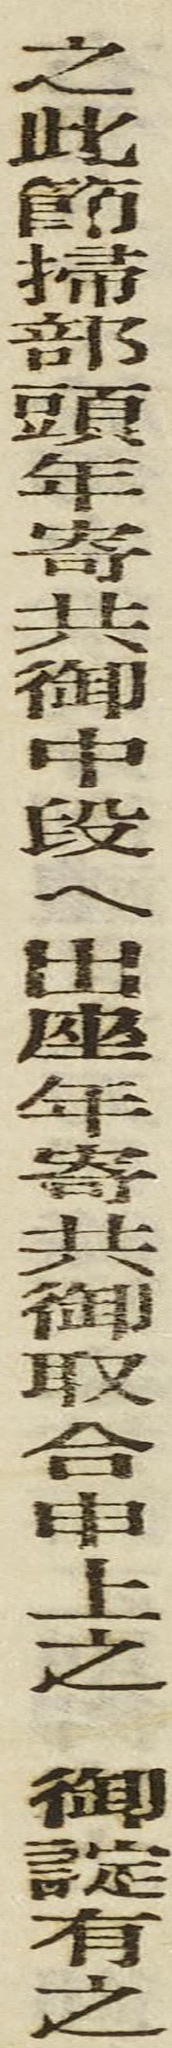之此節掃部頭年寄共御中段へ出座年寄共御取合申上之御諚有之
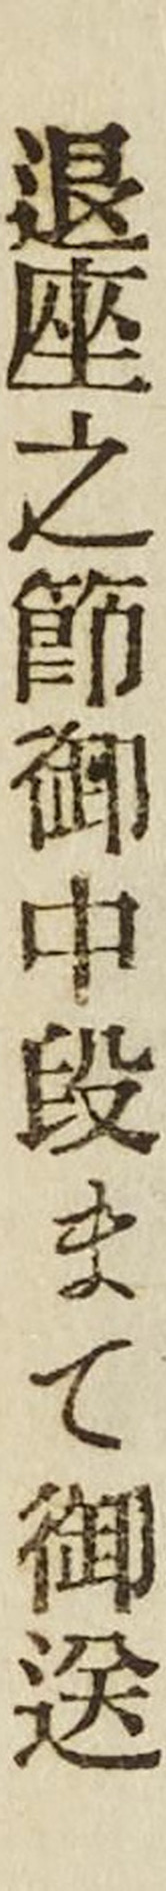退座之節御中段まて御送
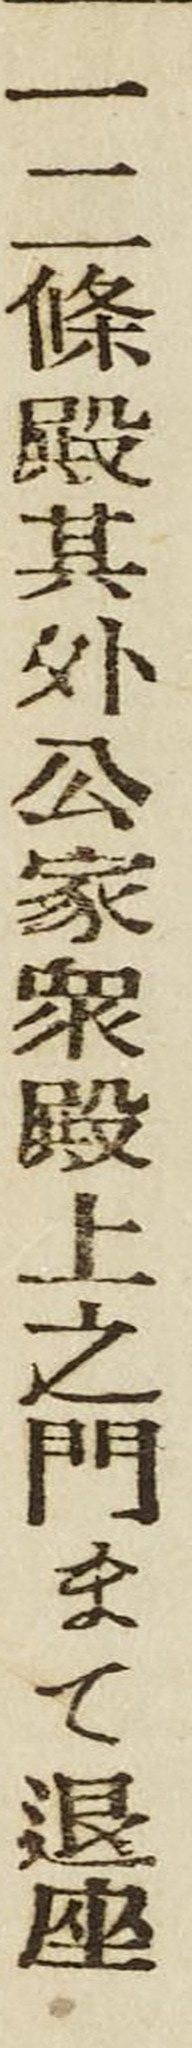一二條殿其外公家衆殿上之門まて退座
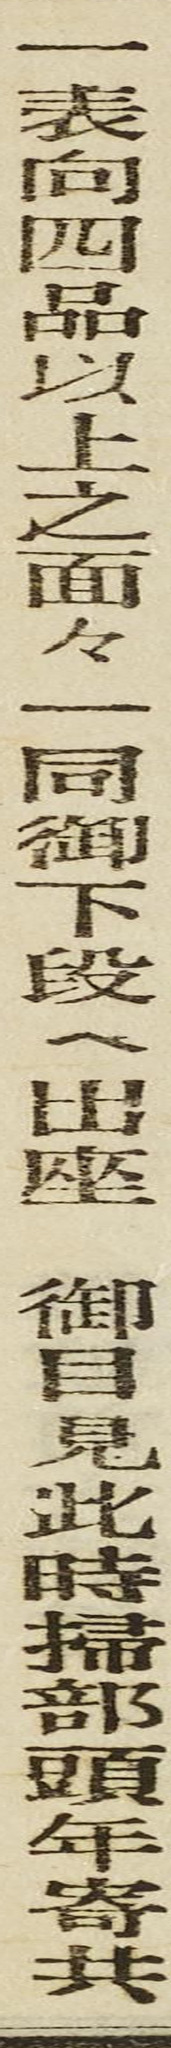一表向四品以上之面々一同御下段へ出座御目見此時掃部頭年寄共
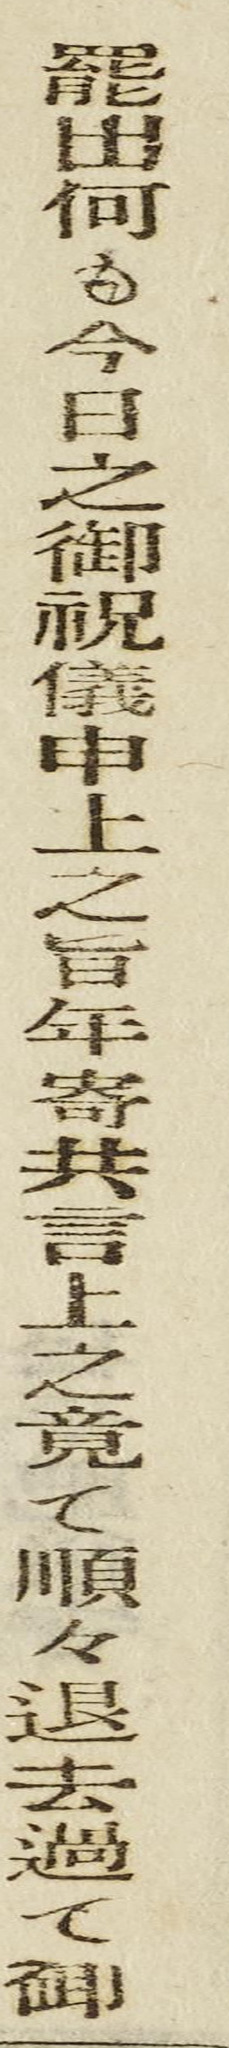罷出何も今日之御祝儀申上之旨年寄共言上之竟て順々退去過て御
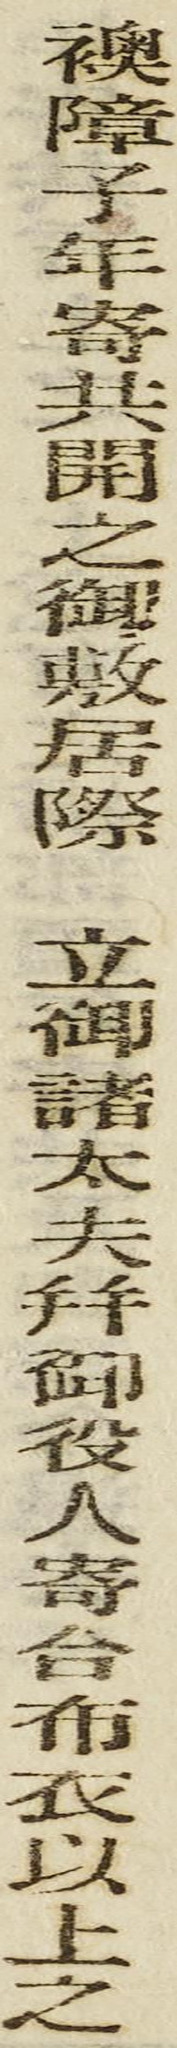襖障子年寄共開之御敷居際立御諸太夫幷御役人寄合布衣以上之
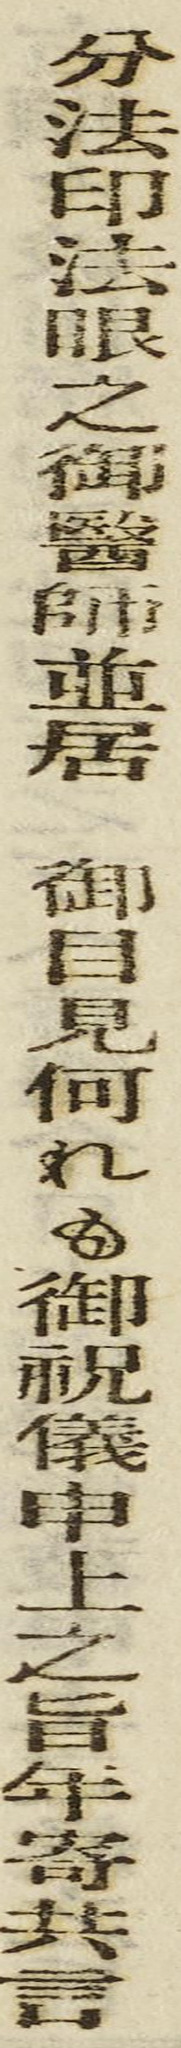分法印法眼之御医師並居御目見何れも御祝儀申上之旨年寄共言
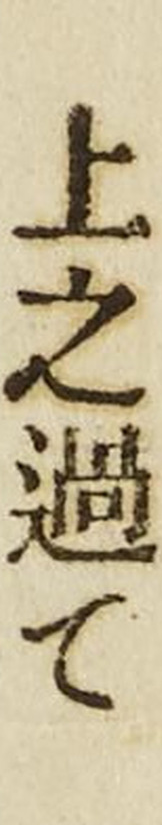上之過て
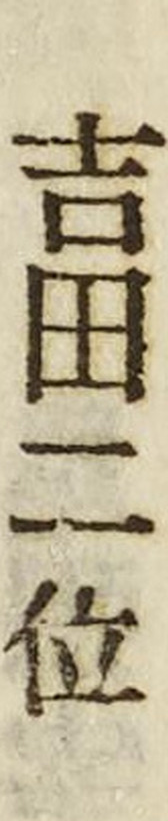吉田二位
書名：史籍集覽　朝鮮陣古文・細井廣澤記・颶風紀事・天明七年將軍宣下次第書　全
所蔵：東京大学地震研究所図書室 Earthquake Research Institute Library, The University of Tokyo, JAPAN
